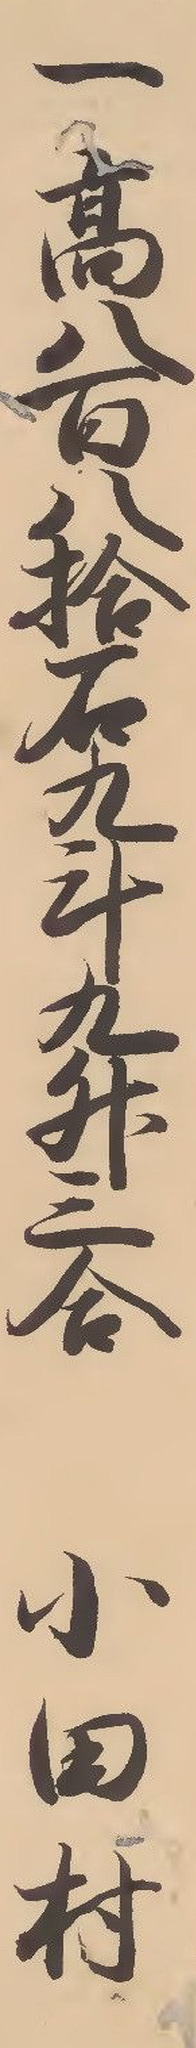一高八百八拾石九斗九弁三合小田村
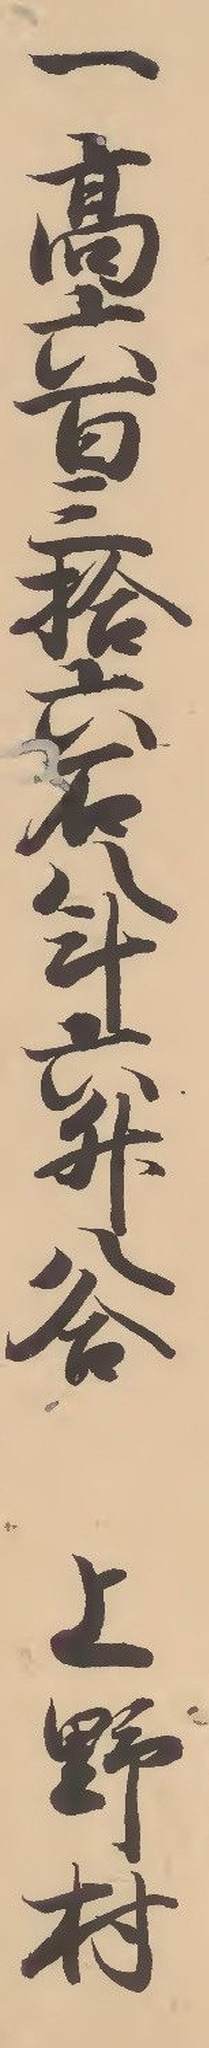一高六百三拾六石八斗六弁八合上野村

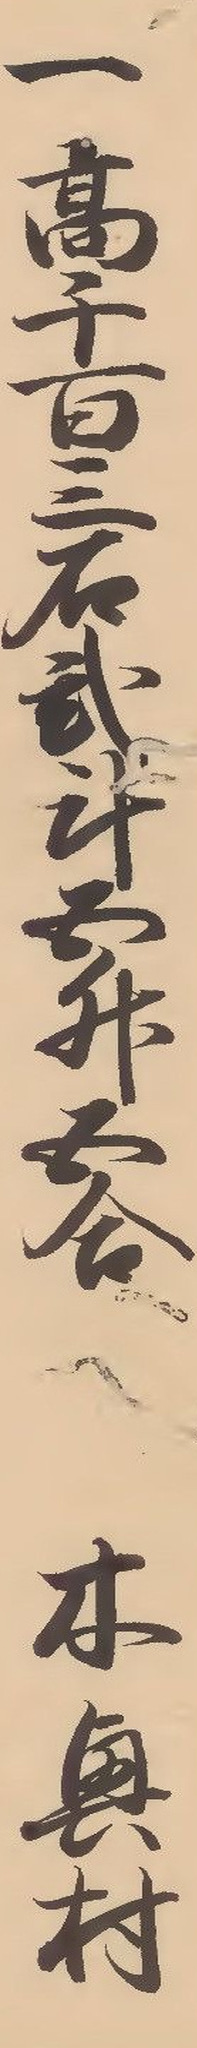一高千百三石弐斗五升五合木興村
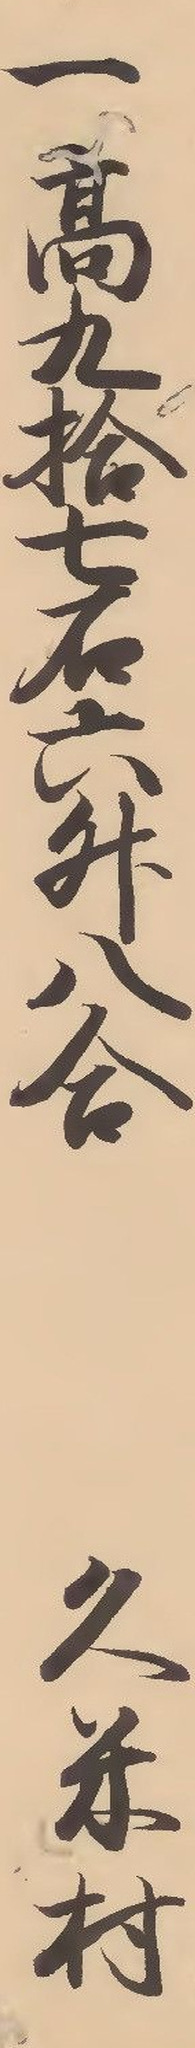一高九拾七石六升八合久米村
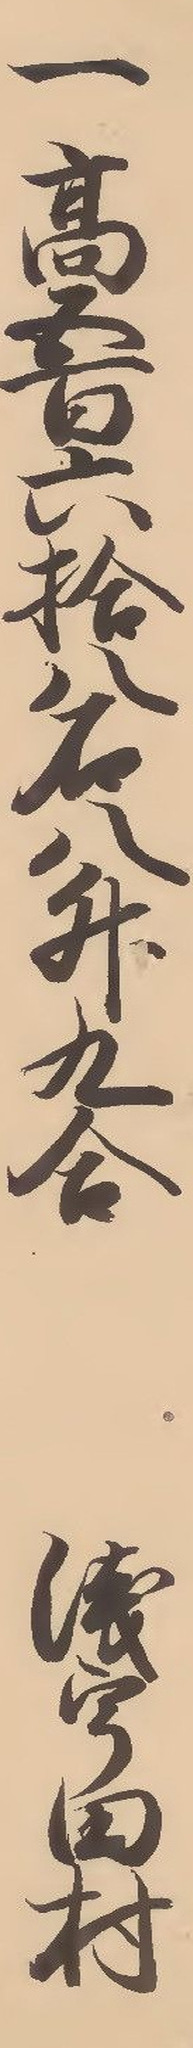一高五百六拾八石八升九合浅宇田村
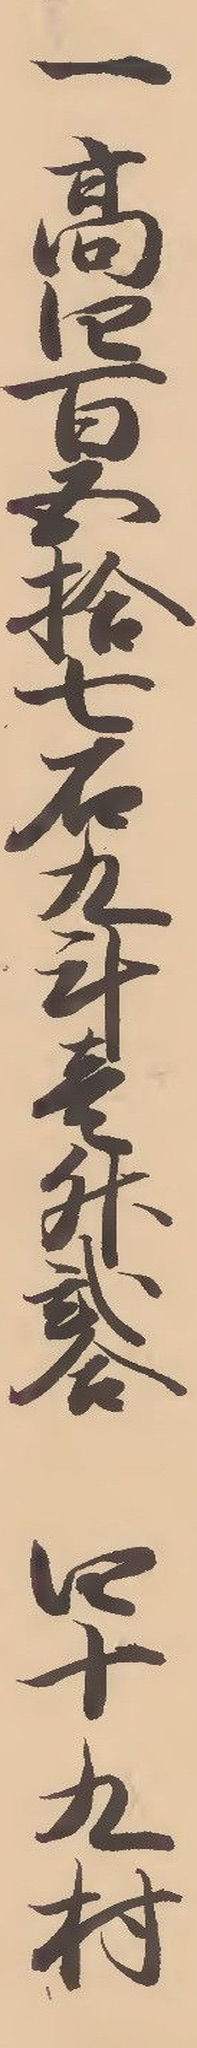一高四百五拾七石九斗壱升弐合四十九村
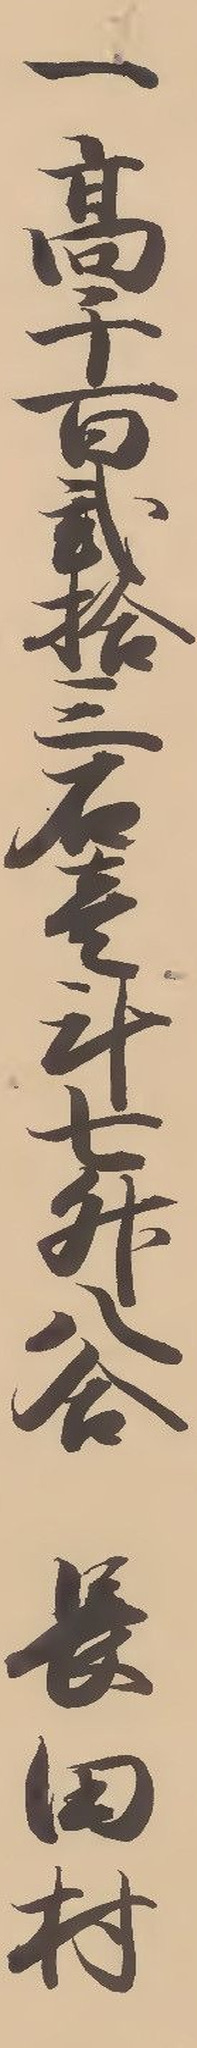一高千百弐拾三石壱斗七升八合長田村
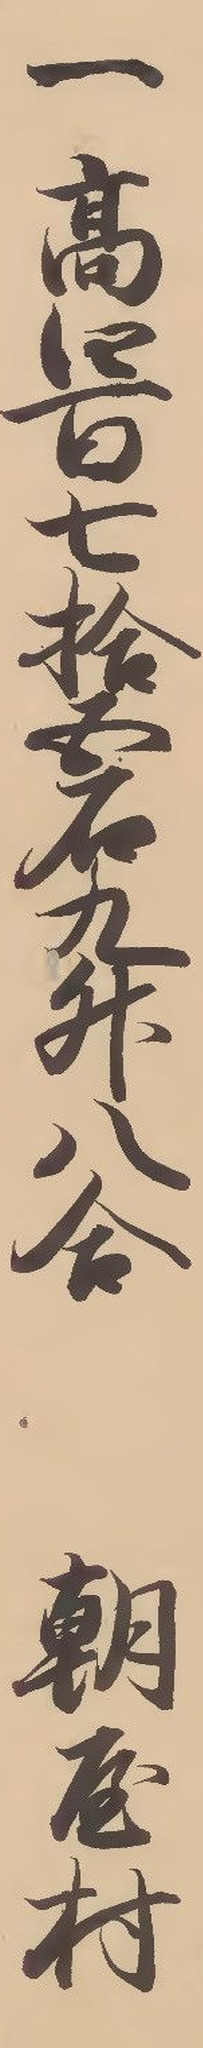一高四百七拾五石九升八合朝屋村
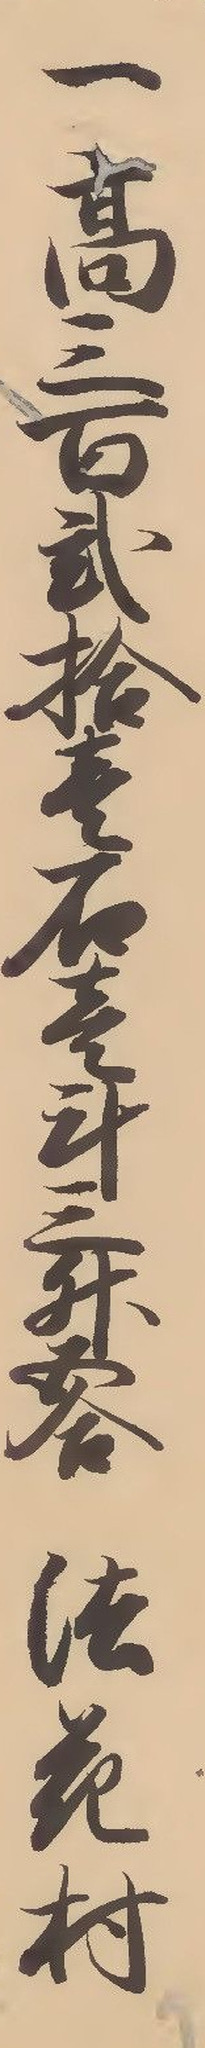一高三百弐拾壱石壱斗三升五合法花村
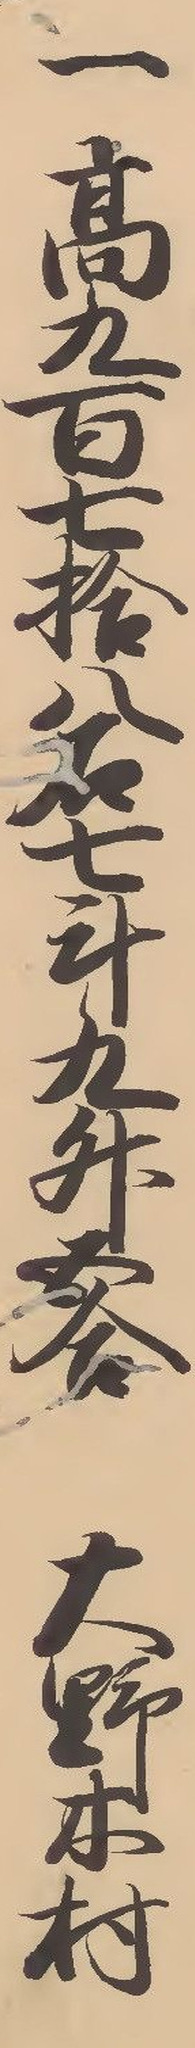一高九百七拾八石七斗九升五合大野木村

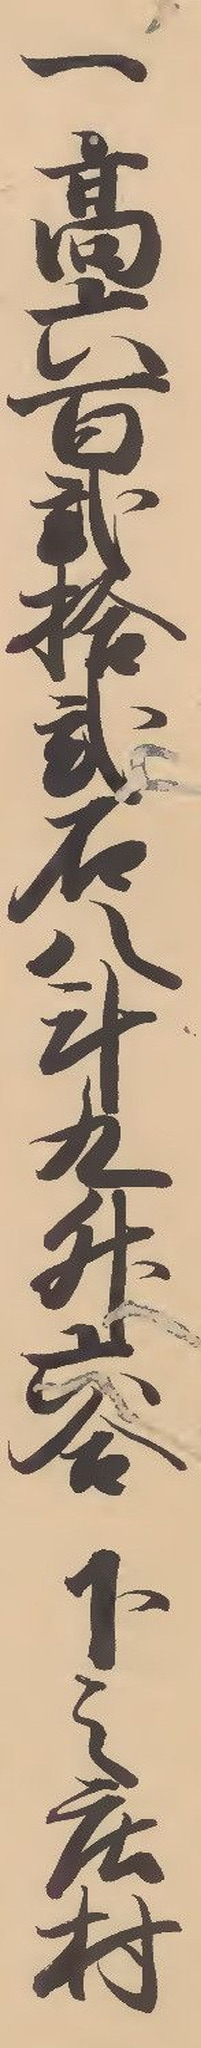一高六百弐拾弐石八斗九升六合下之庄村
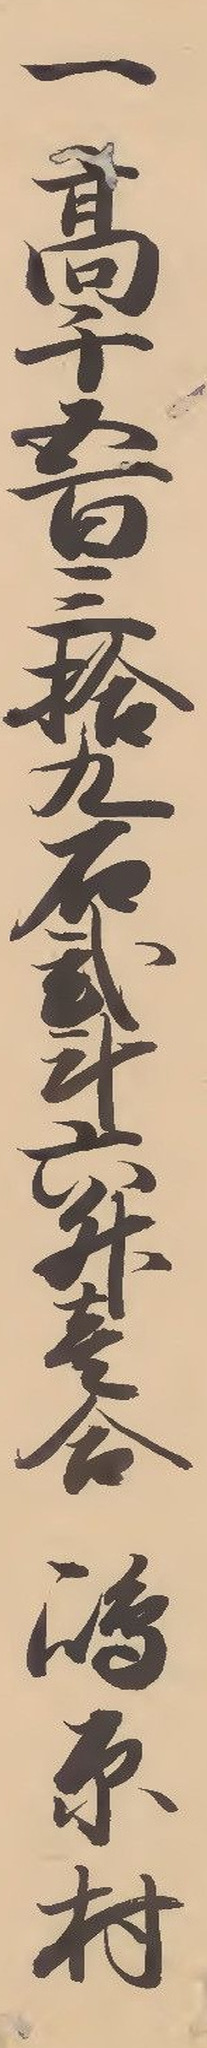一高千五百三拾九石弐斗六升壱合島原村
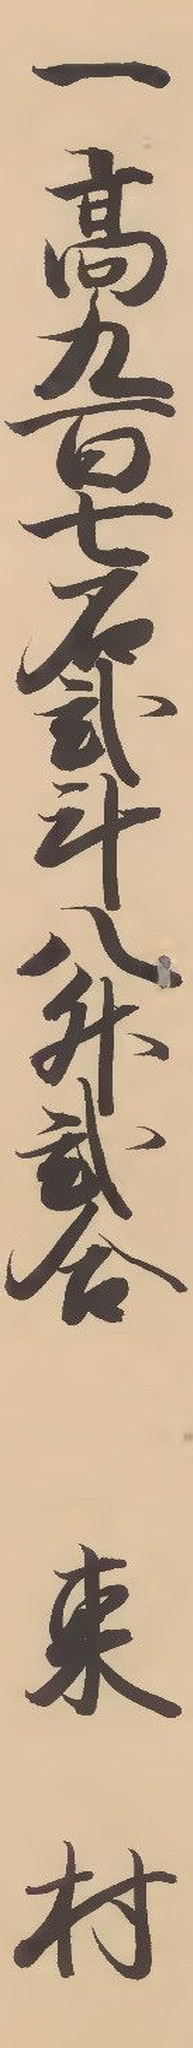一高九百七石弐斗八升弐合東村
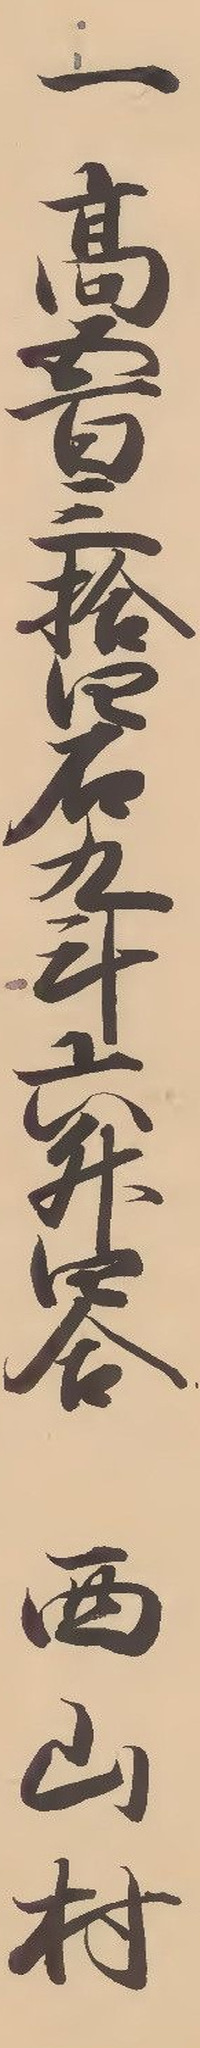一高五百三拾四石九斗六升四合西山村
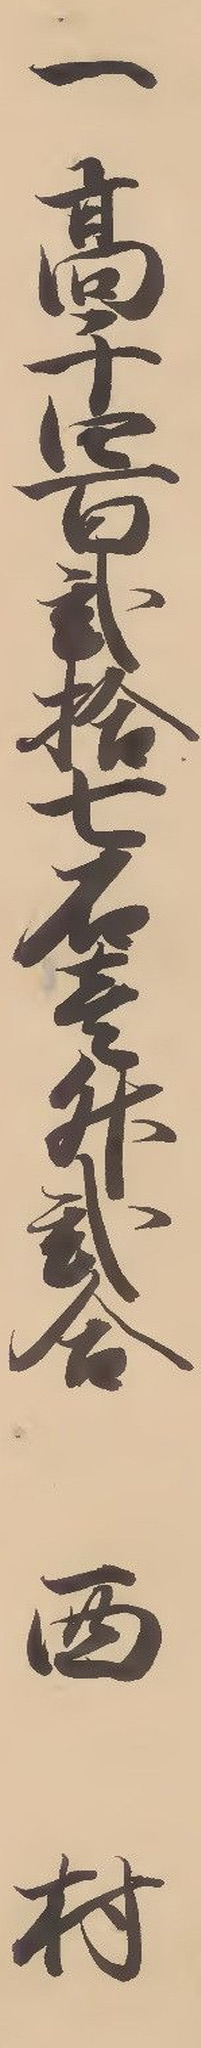一高千四百弐拾七石壱升弐合西村
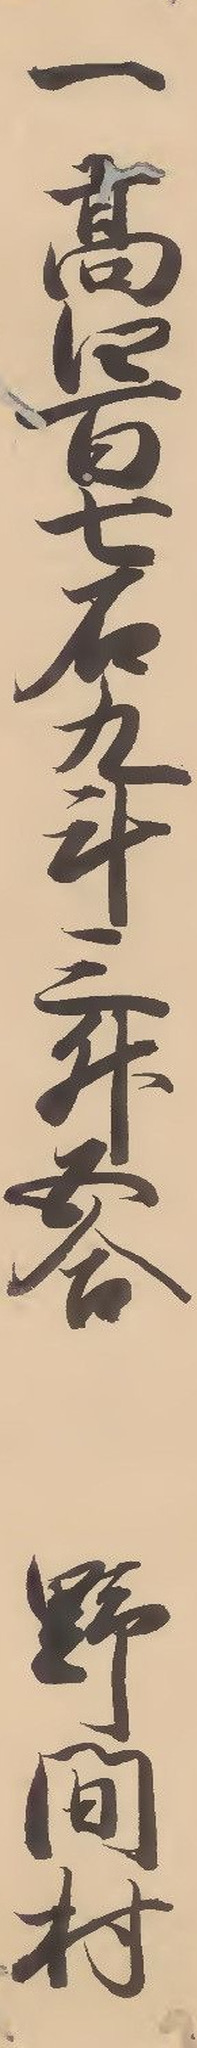一高四百七石九斗三升五合野間村
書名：伊賀国郷帳
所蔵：国立公文書館 National Archives of Japan
